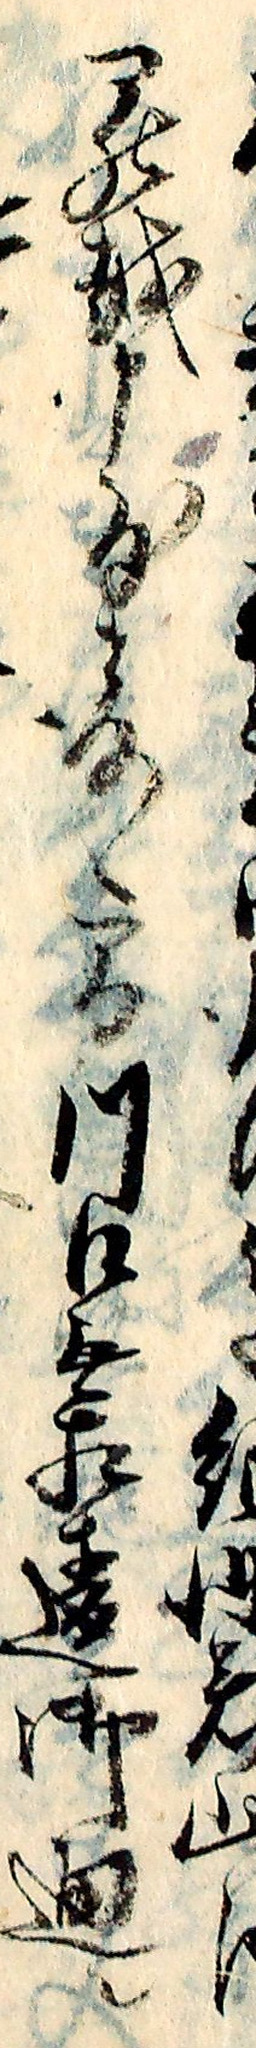罷越申度奉存候間川口無相違御通し
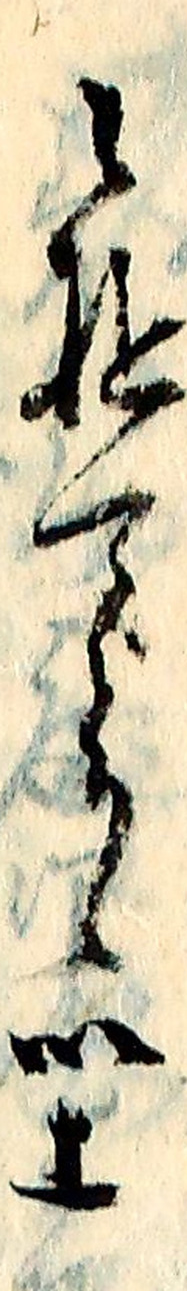被遊可被下候以上
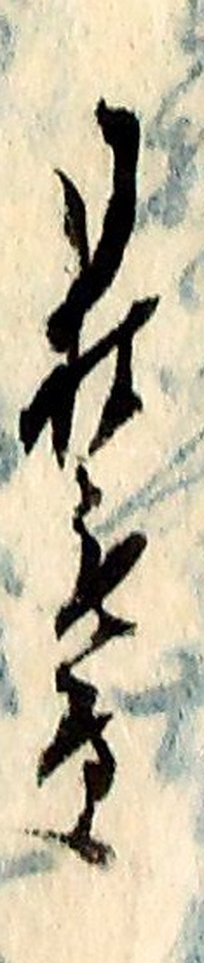同村庄屋
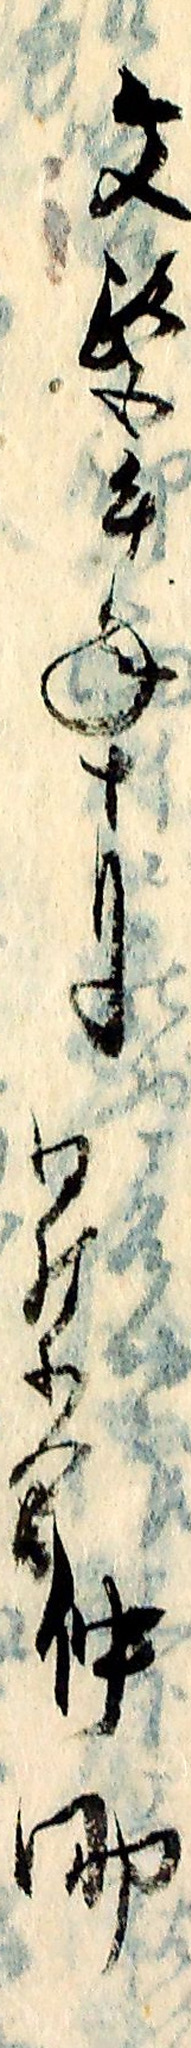文政五午年十月同村五人与
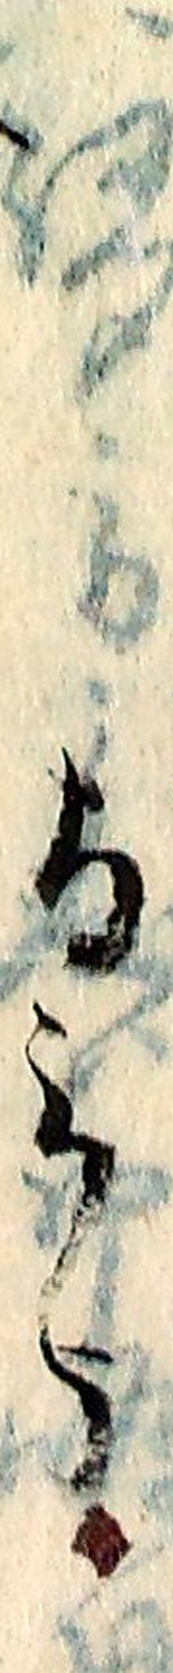与三郎
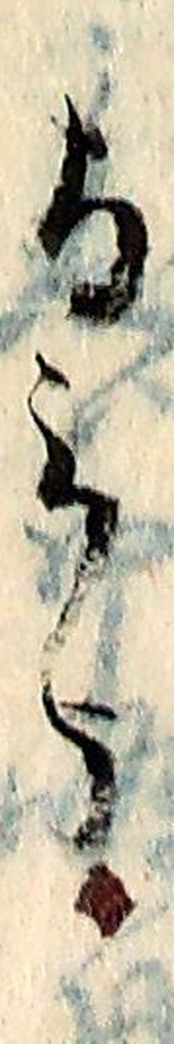与三郎
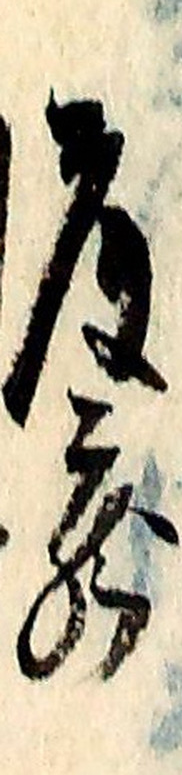同藤蔵
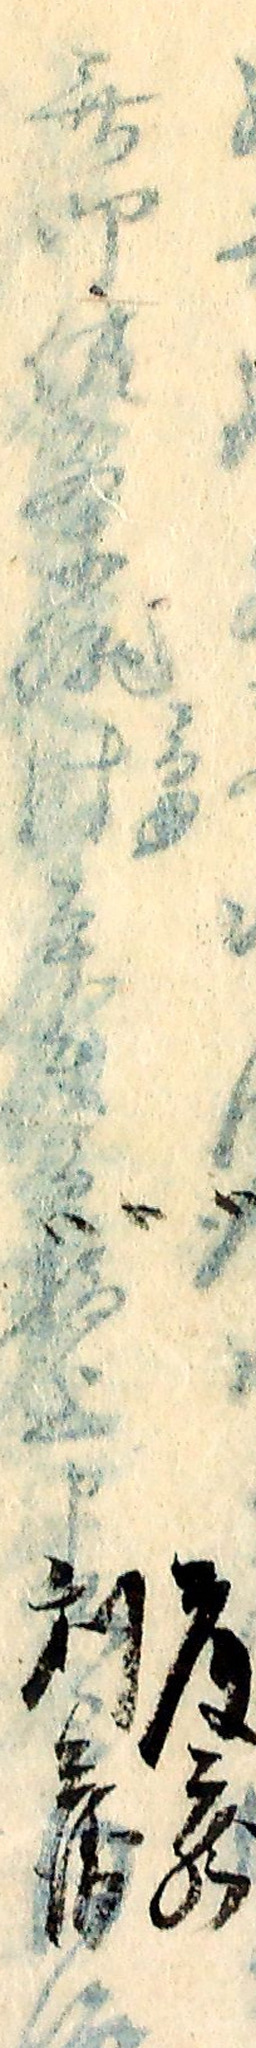同利兵衛
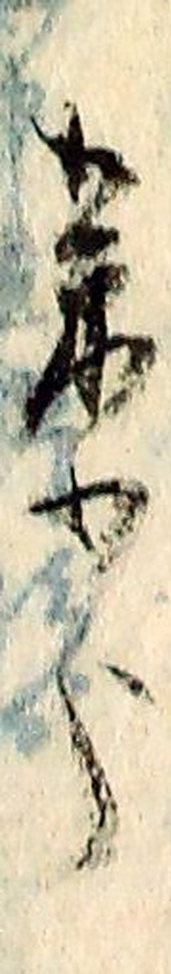同栄五郎

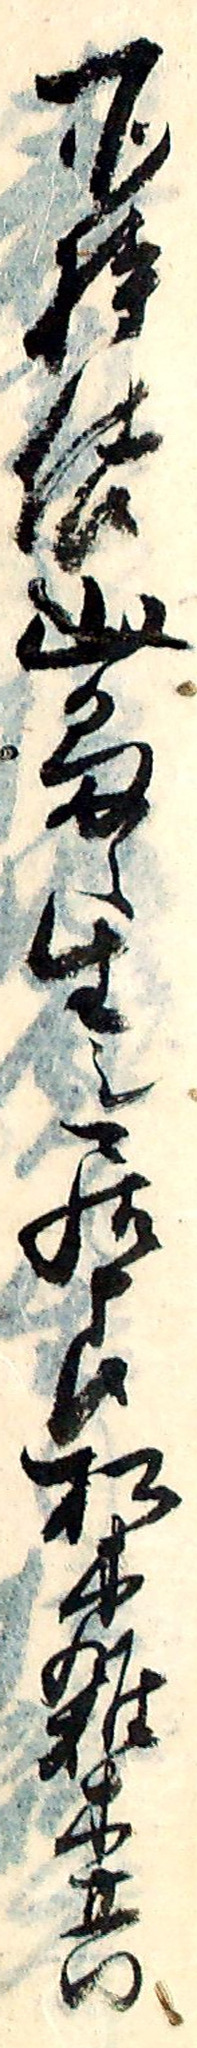所持仕候山畠に生し居申候松木雑木共
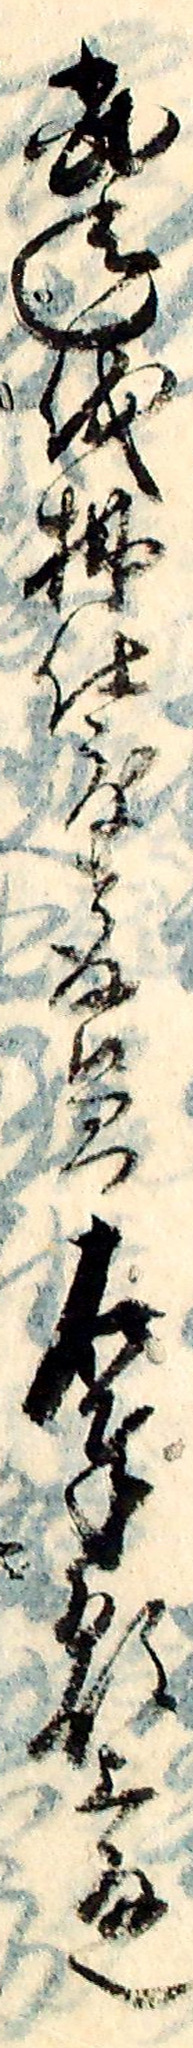当年儀払仕度奉存候間右奉願上通
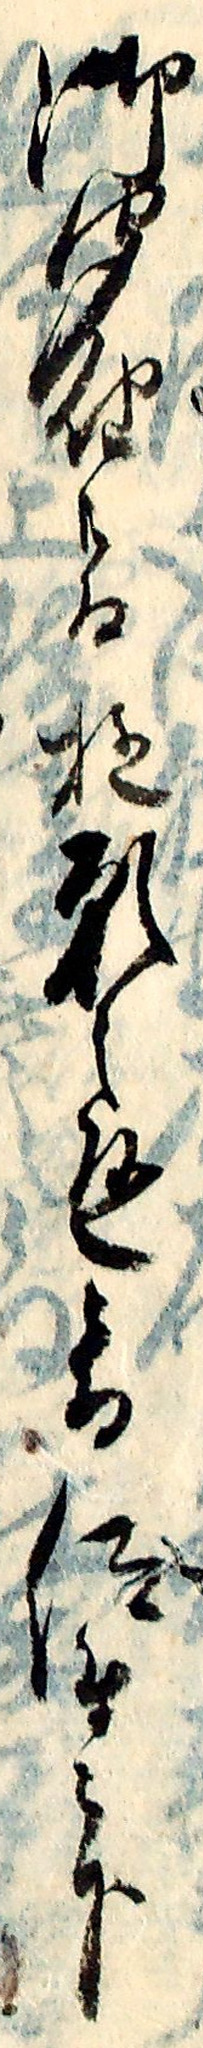御聞届被為遊願之通被為仰付被下
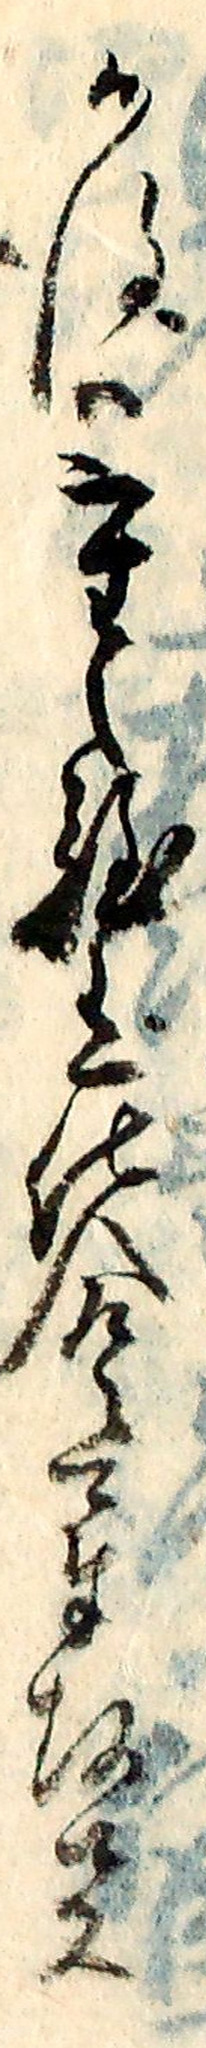候得は重々難有仕合に可奉存候以上
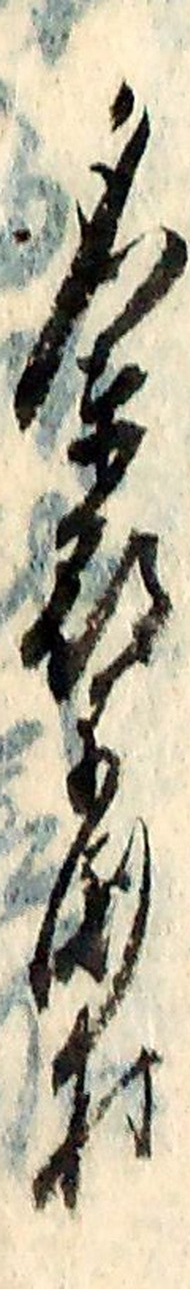名東郡早淵村
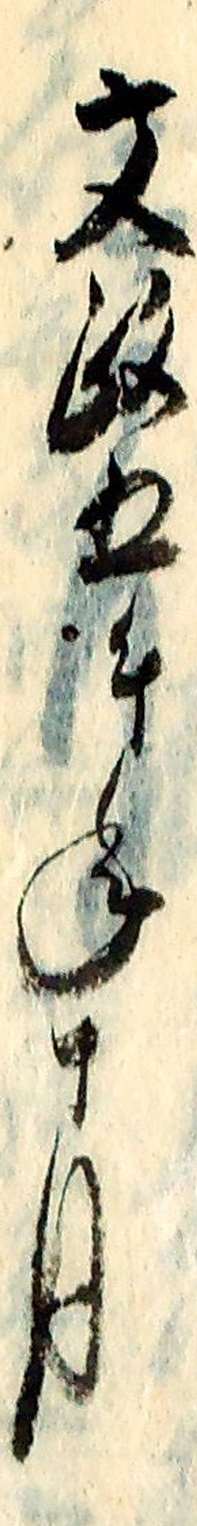文政五午年十月
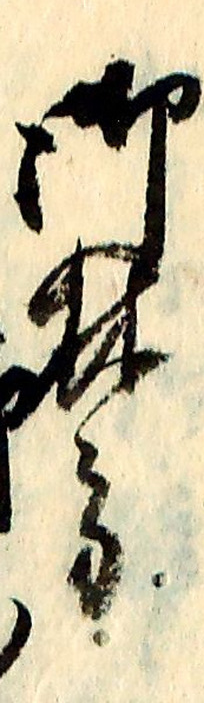御林方
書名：諸御願書控(後藤氏壱番）
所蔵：鳴門教育大学 Naruto University of Education
